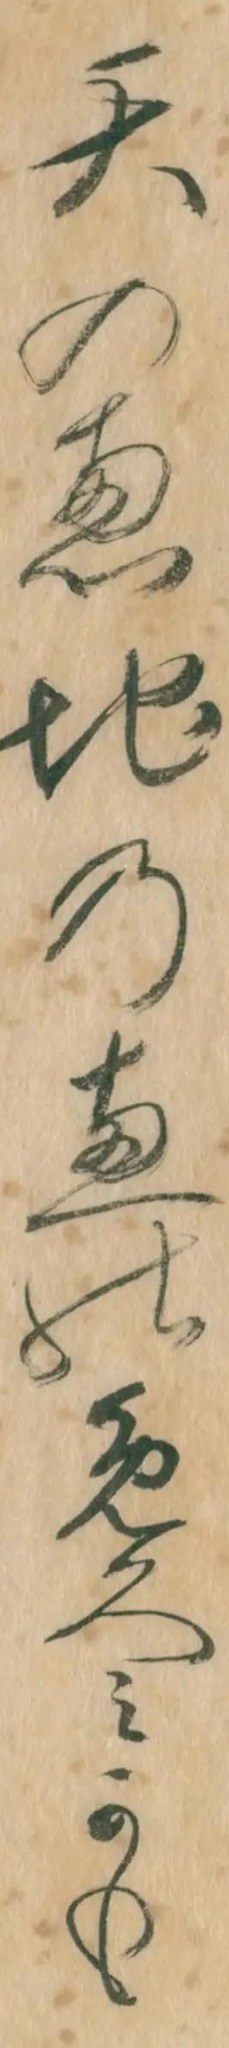天の恵地の恵のめくみかも
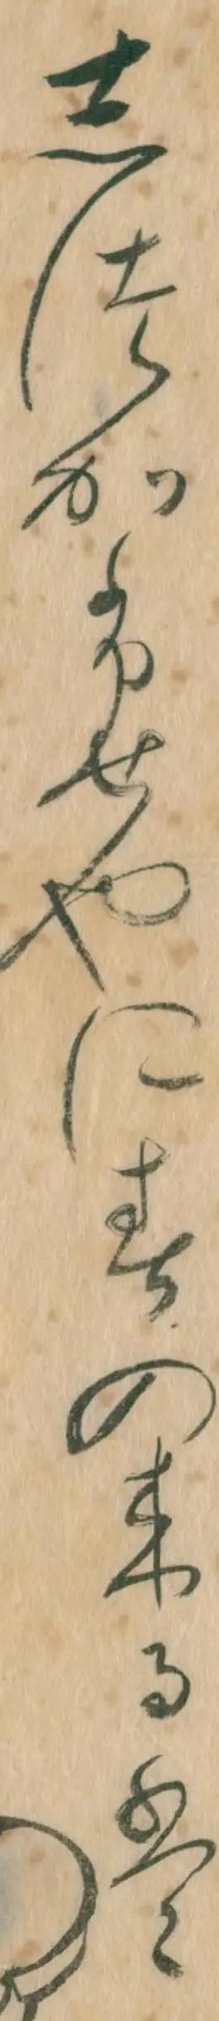しつかふせやに春の来る盤
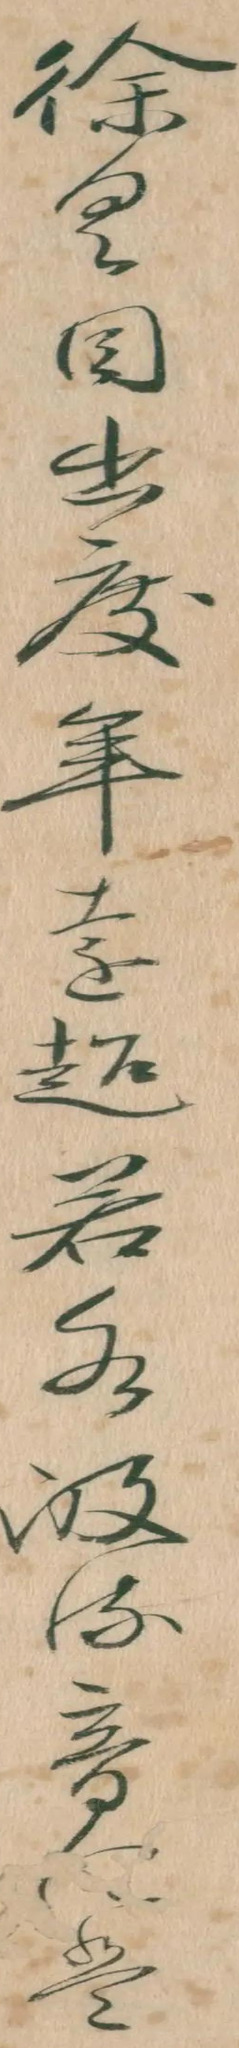徐く目出度年を超若水汲る音には
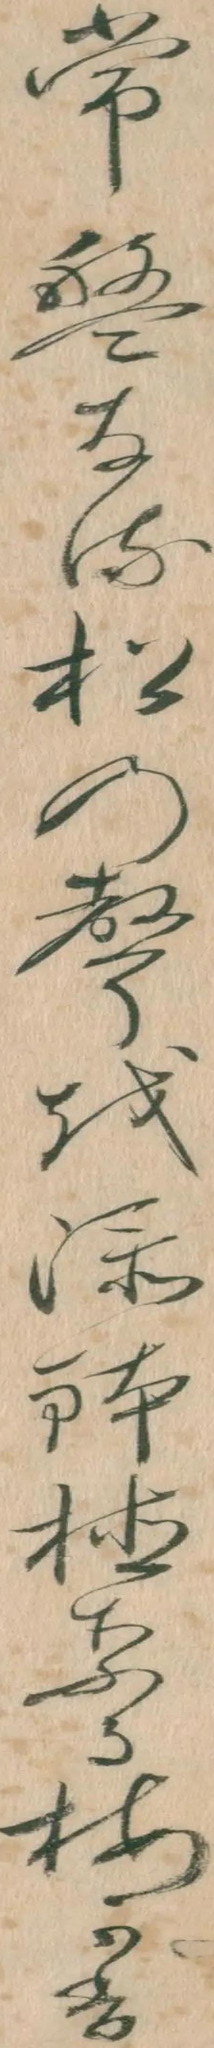常盤なる松の聲を添鉢植なる梅か香
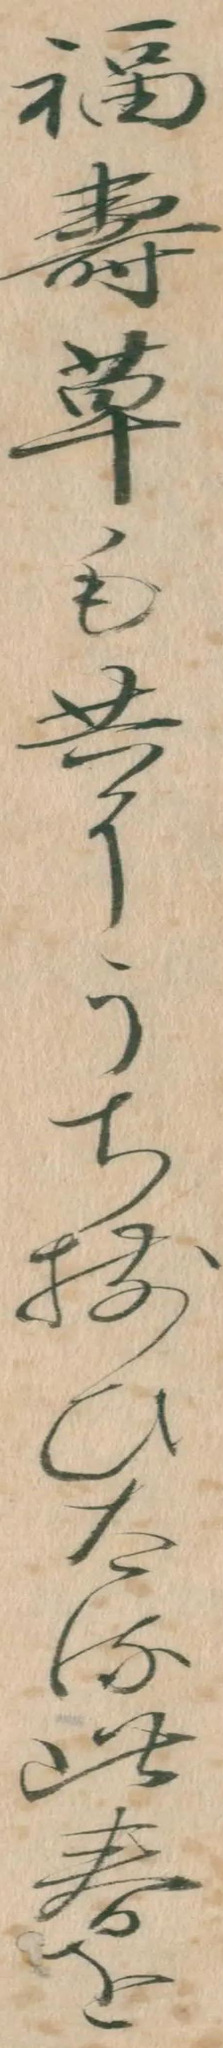福壽草も共にうち揃ひたる此春を
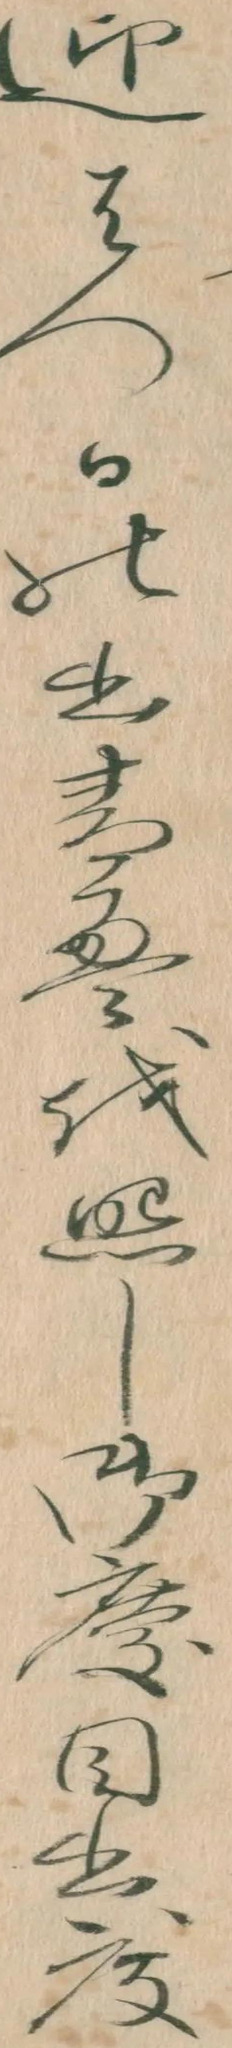迎はつ日の出青畳を照し御慶目出度
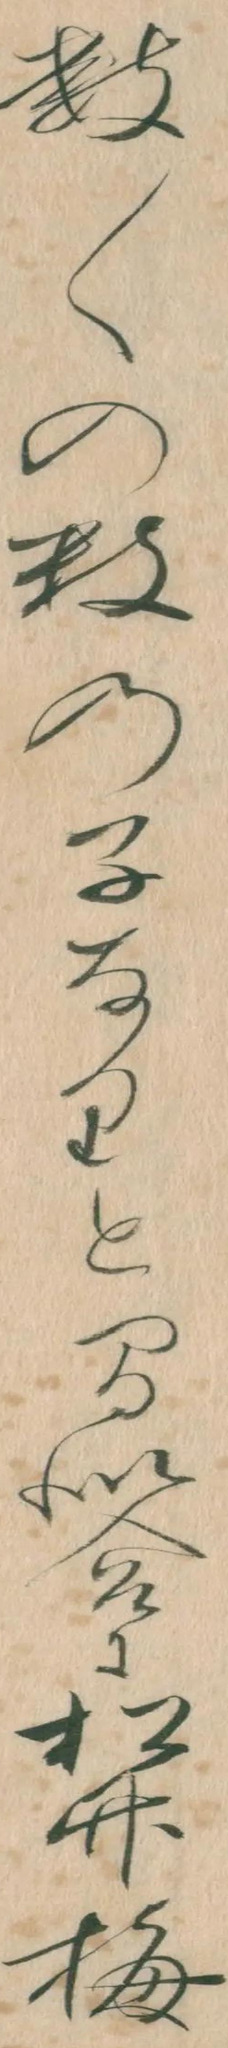数〳〵の数の子なりと間似合に松竹梅
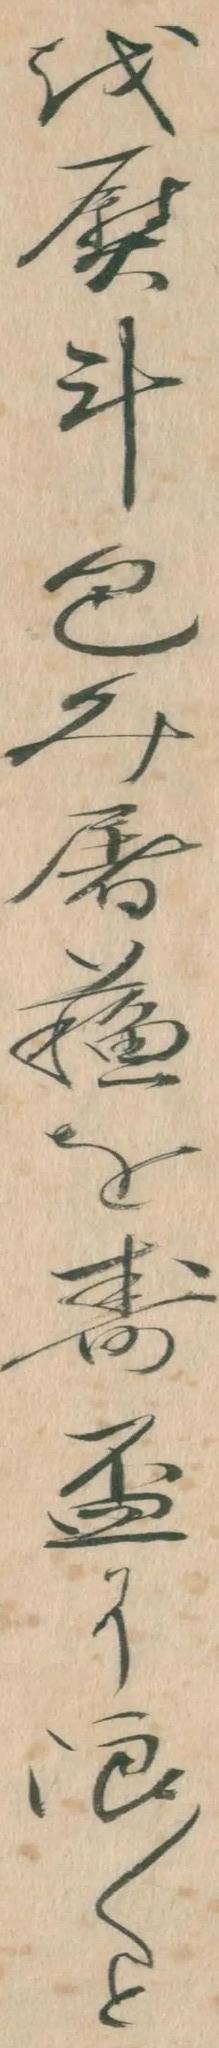を熨斗包み屠蘓を寿盃に浪〳〵と
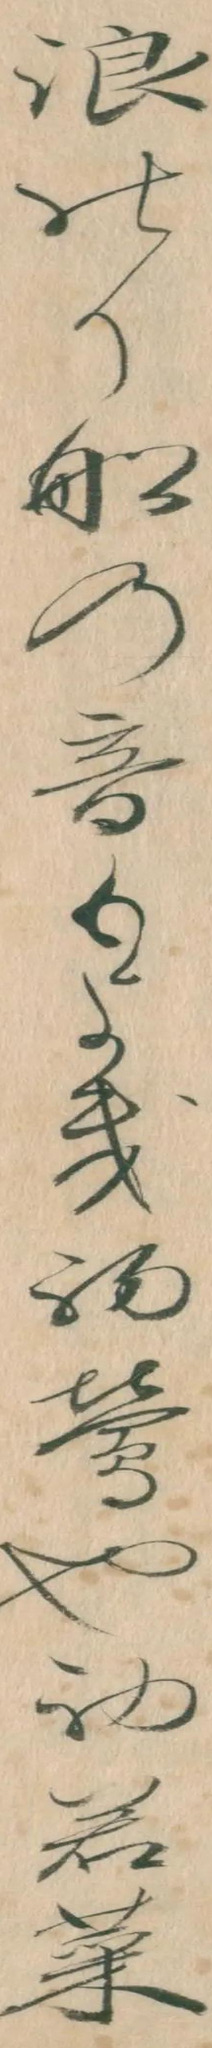浪のり船の音もよき初鶯や初若菜
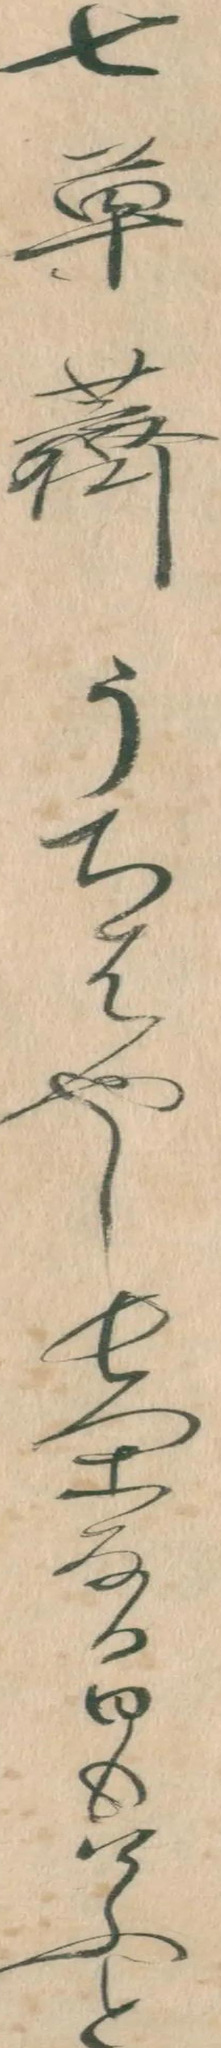七草薺うちはやし長閑なる日もけふと
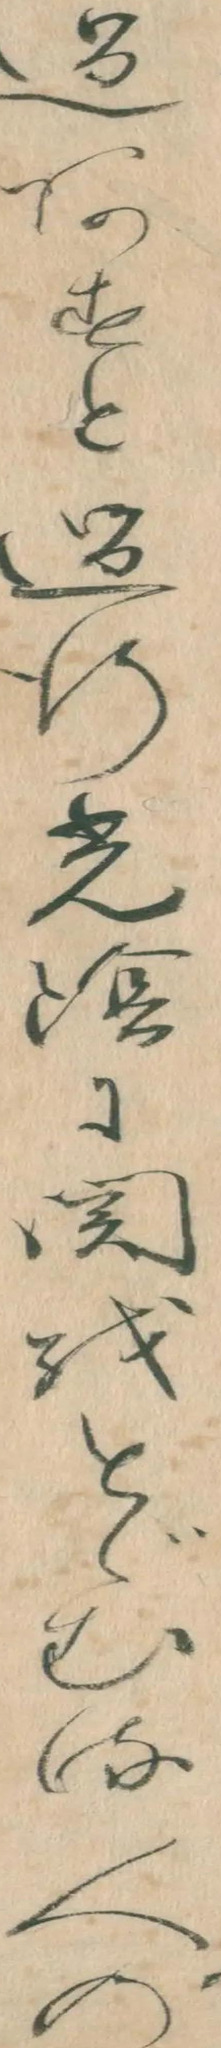過あすと過行光陰に関をとじむる人の

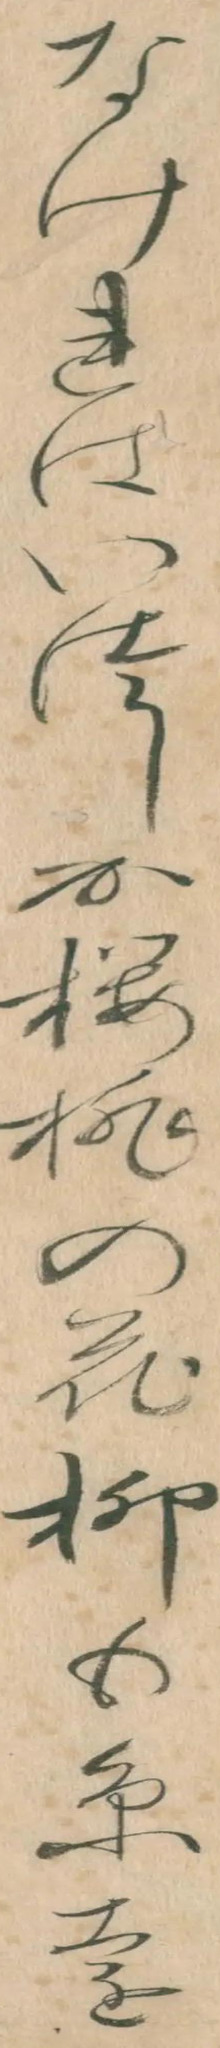なけれはいつしか桜桃の花柳も糸を
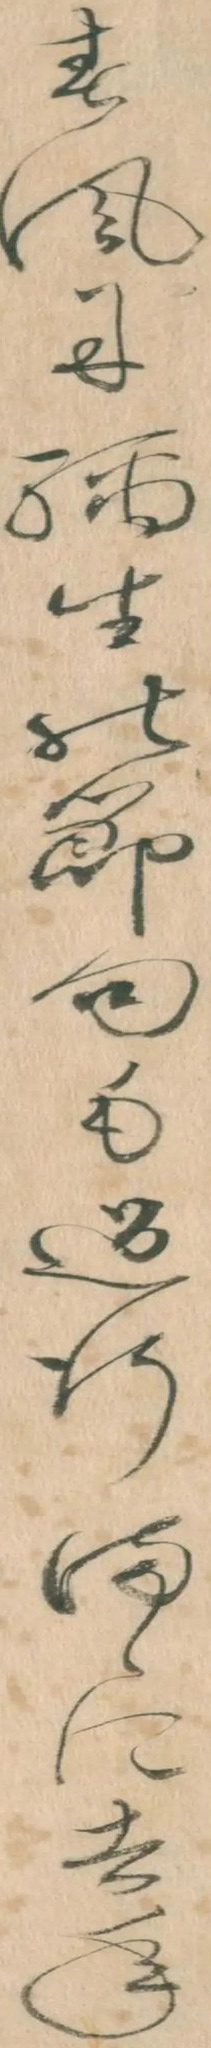春風に彌生の節句も過行まゝに去年
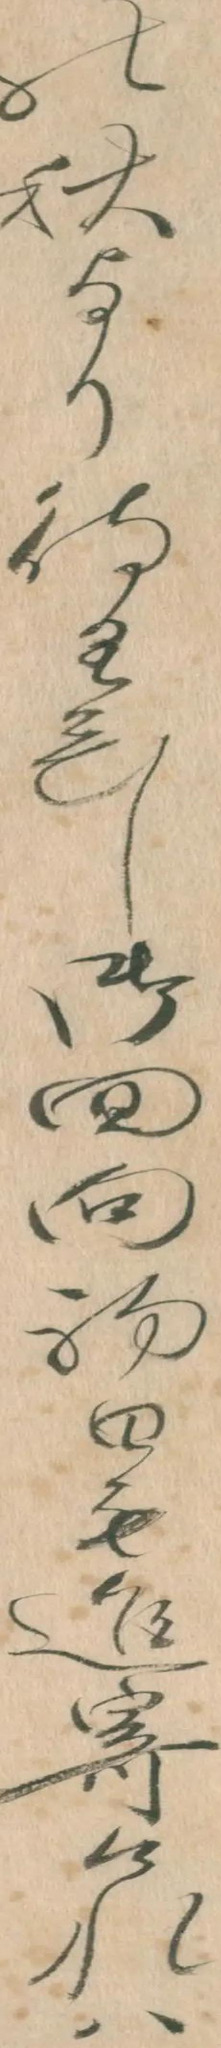の秋より待わひし御回向初日も近寄けれは
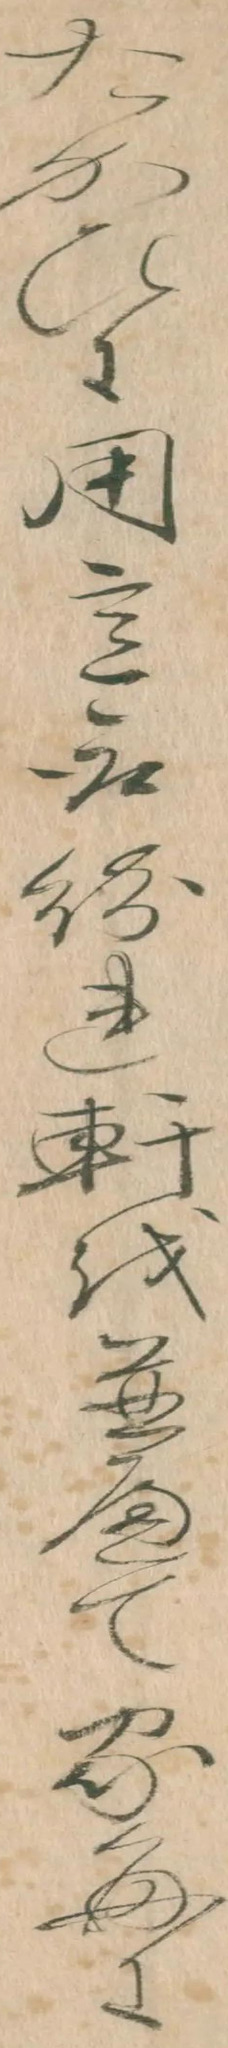たかひに用意取紛れ軒を並へて家毎に
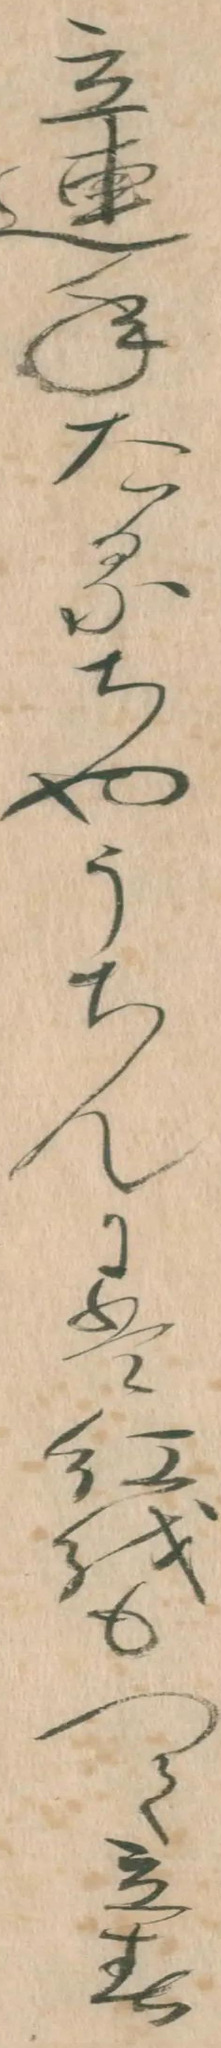立連ねたるちやうちんには紅をもつて立春
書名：俗語之種. [2]
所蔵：国立国会図書館 National Diet Library, JAPAN
